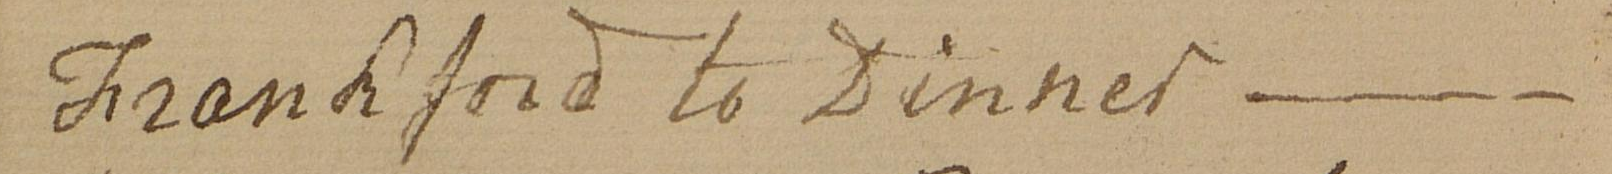Frankford to Dinner--
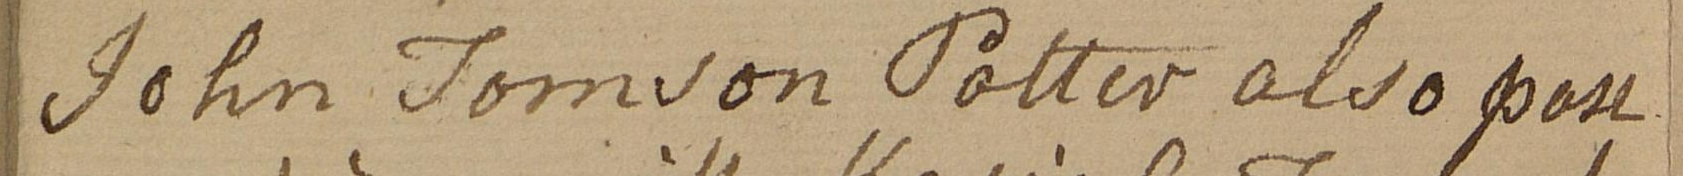John Tomson Potter also pass
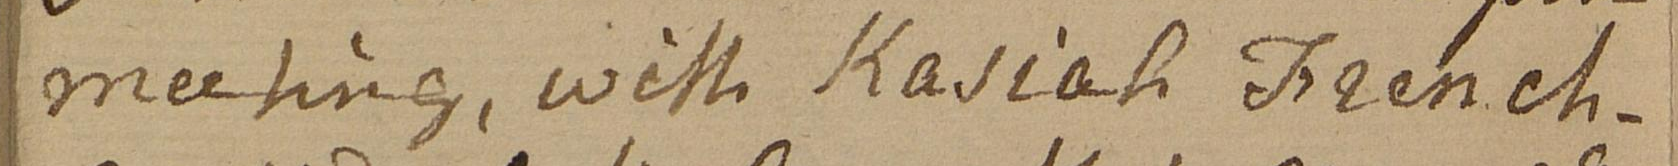meeting, with Kasiah French-
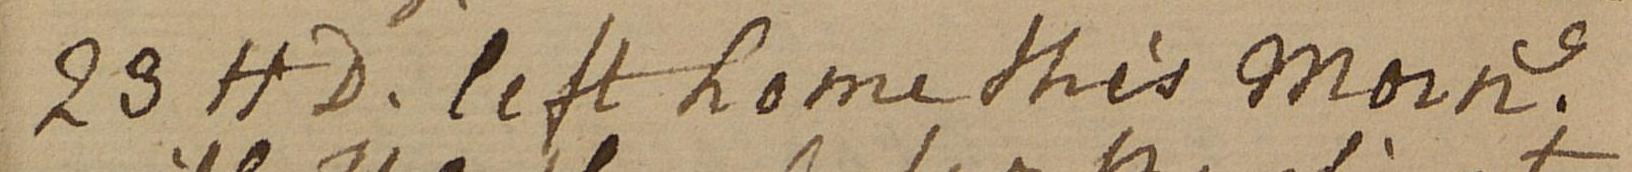23 HD. left home this Morn^g.
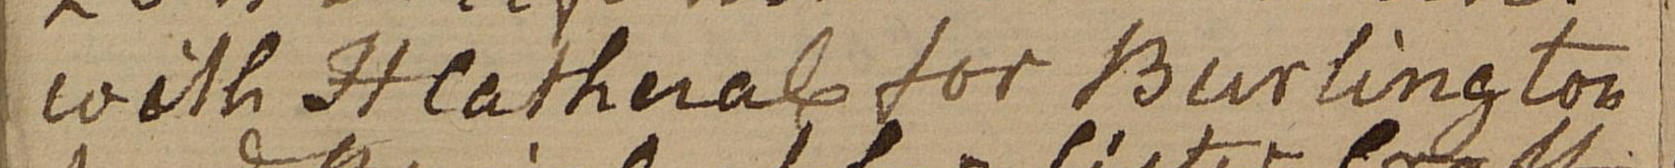with H Catheral for Burlington
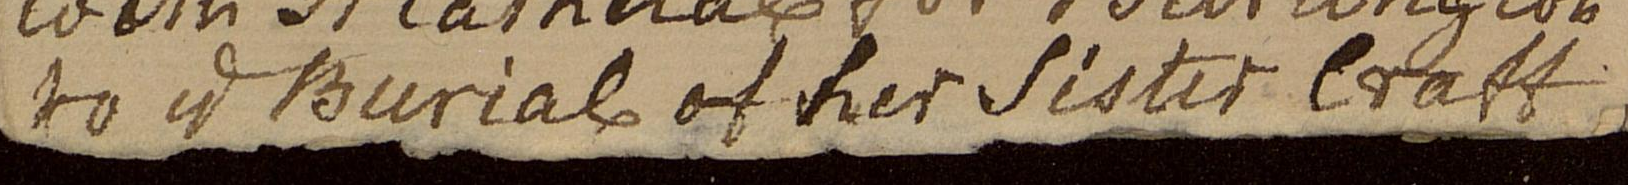to y^e Burial of her Sister Craft
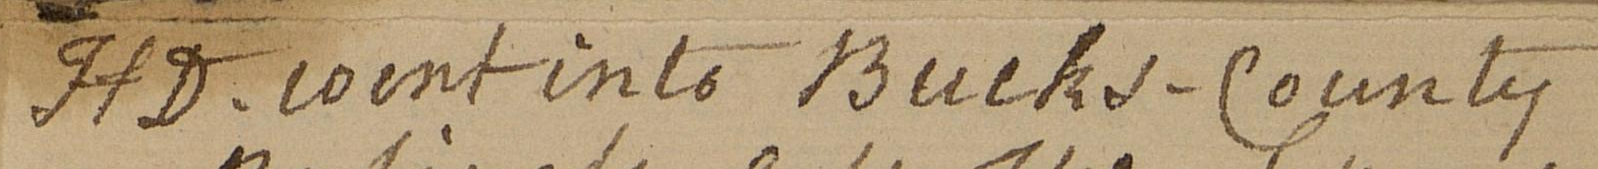HD. went into Bucks-County
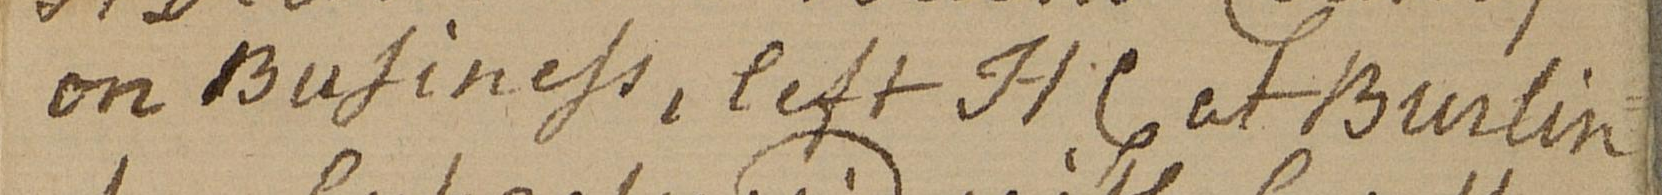on Business, left HC at Burlin
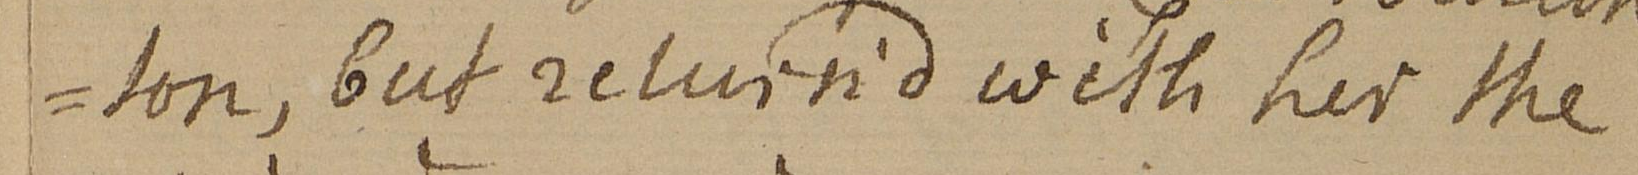-ton, but return'd with her the
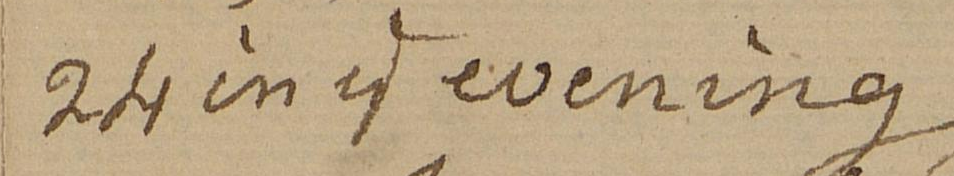24 in y^e evening
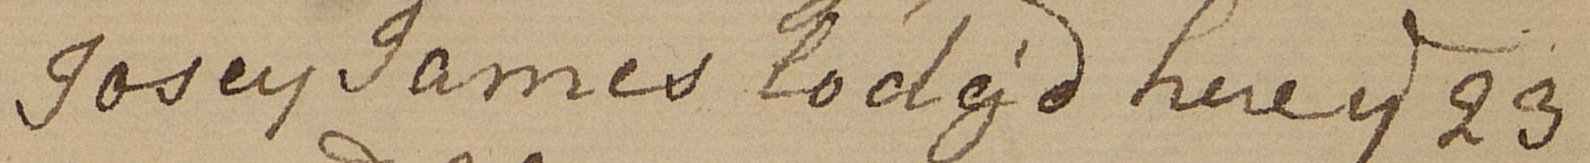Josey Tames lodg'd here y^e 23
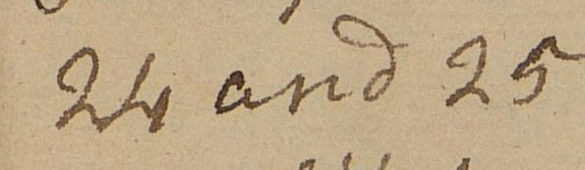24 and 25
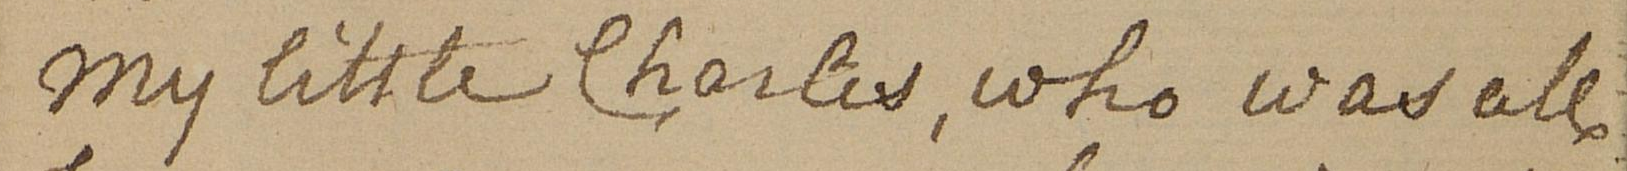My little Charles, who was all
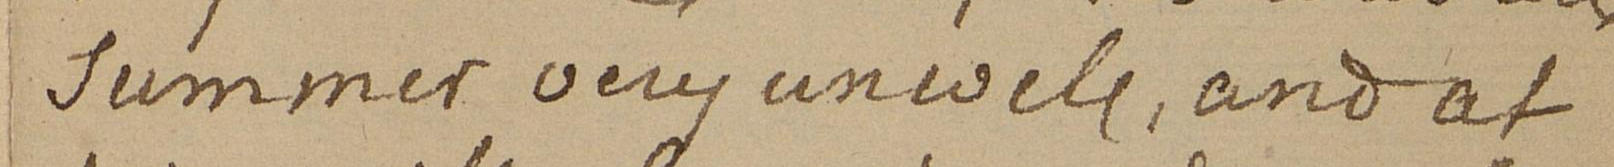Summer very unwell, and at
